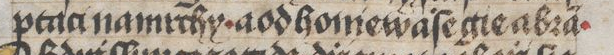ptici na mrchy.a od honiewaẛe gie abrā.
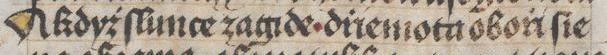A kdyż ſlunce zagide.dṙíemota ohoṙí ſie
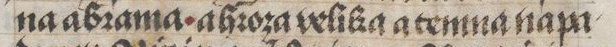na a brama.a hroza velika a temna na pa¬
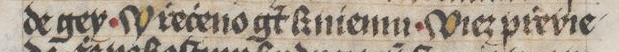de gey.Y ṙeċeno ḡt k niemu.Viez pṙevie¬
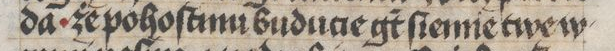da.że pohoſtinu buducie ḡt ſiemie twe w
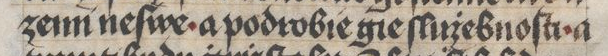zemí neſwe.a podrobíe gie ſlużebnoſti.a
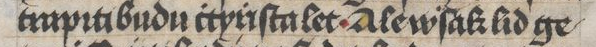trapiti budu ċtyṙiſta let.Ale wẛak lid ge¬
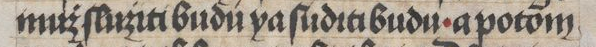muż ſlużiti budú ya ſuditi budu.a potom
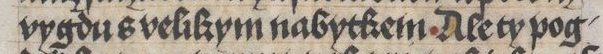vygdu s velikym nabytkem.Ale ty pog¬
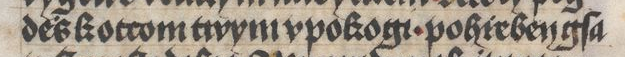deṡ k otcom twym y pokogi.pohṙeben gſa
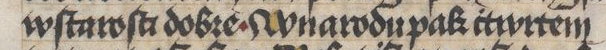wſtaroſti dobre.Wnarodu pak ċtwrtem
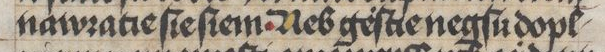nawratie ſie ſiem.Neb geẛtie negſu dopl¬
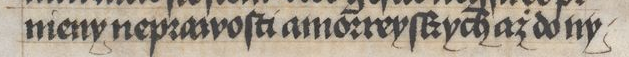meny neprawoſti amiozṙeyſkych aż do ny¬
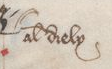āl diely
